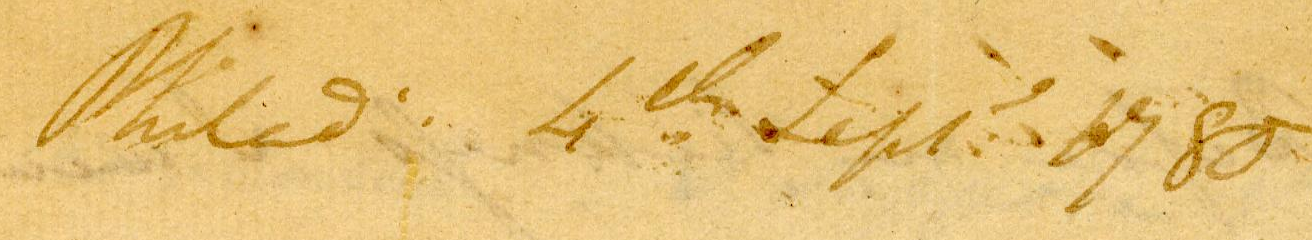Philad^a 4^th. Sept^r. 1780
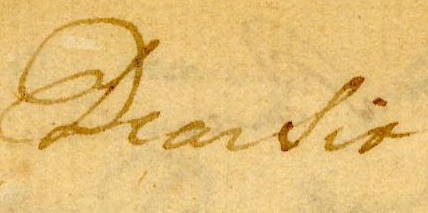Dear Sir
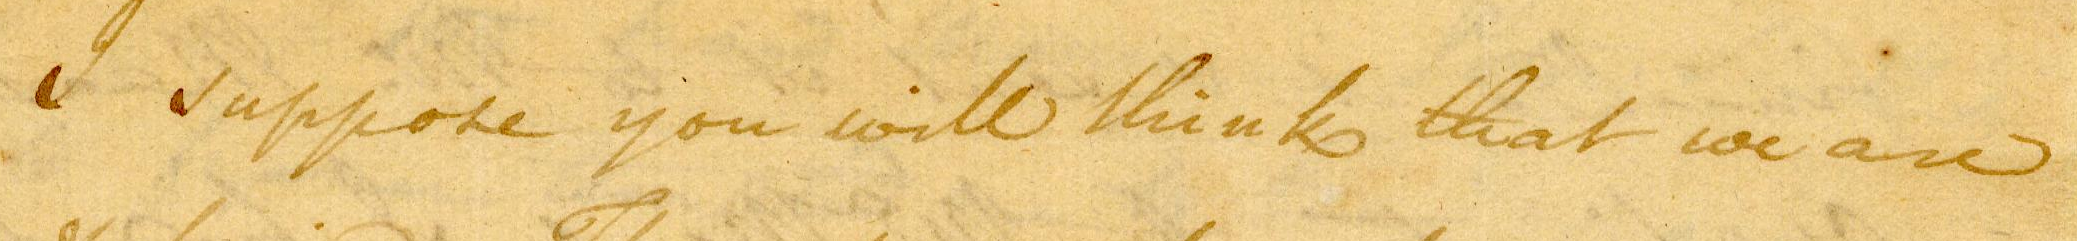I suppose you will think that we are
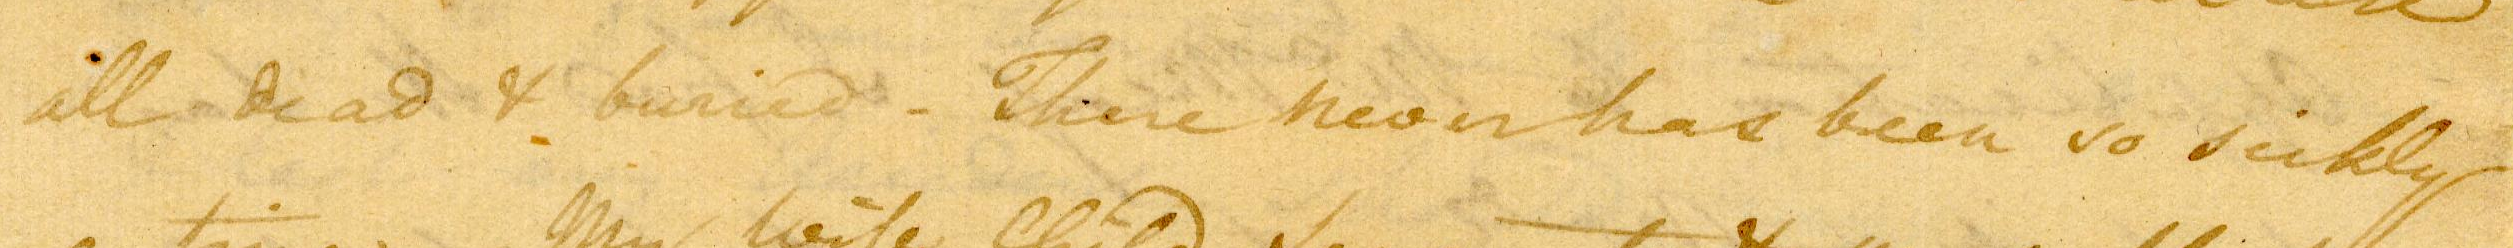ill dead & buried. There never has been so sickly
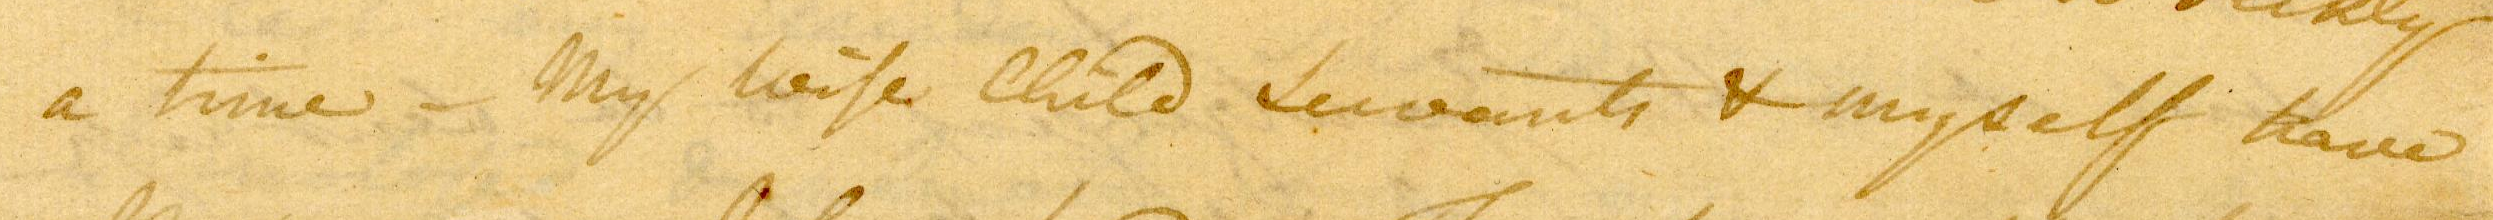a time. My wife child servants & myself have
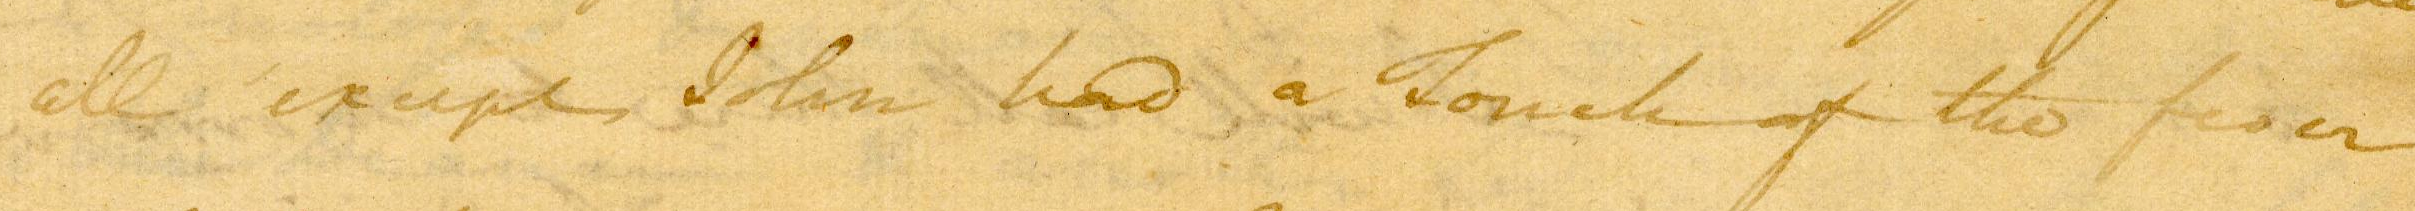all except John had a Touch of the fever
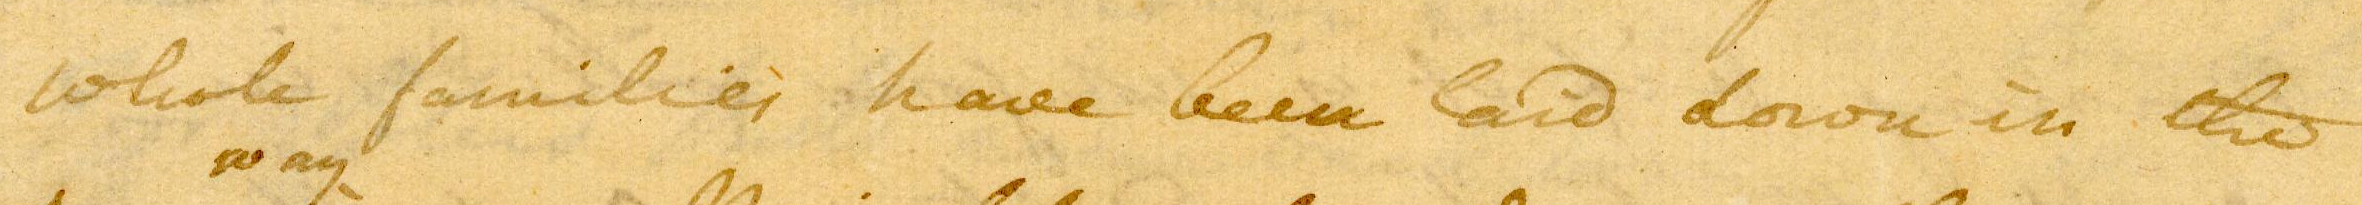whole families have been laid down in the
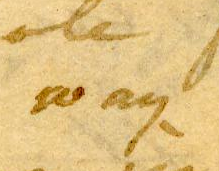way
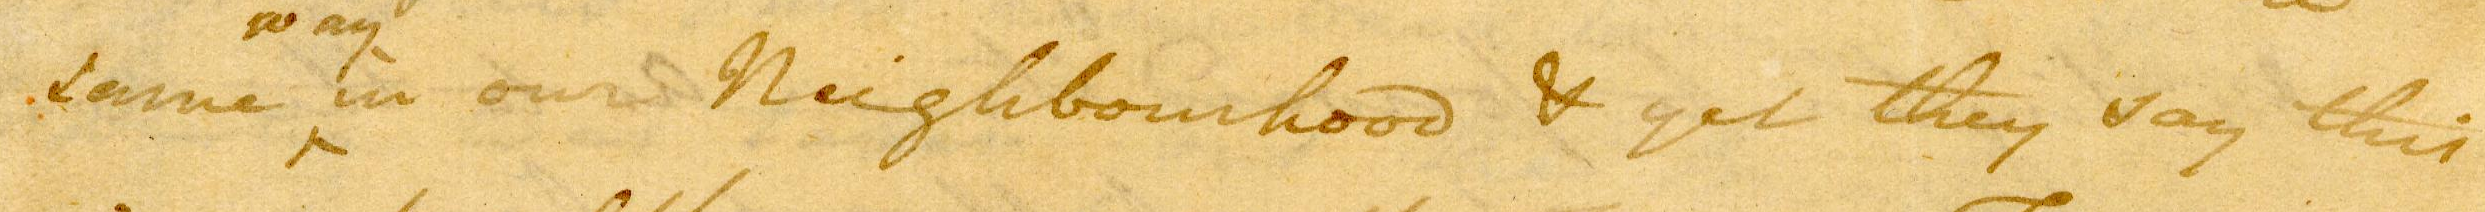same ^ in our Neighbourhood & yet they say this
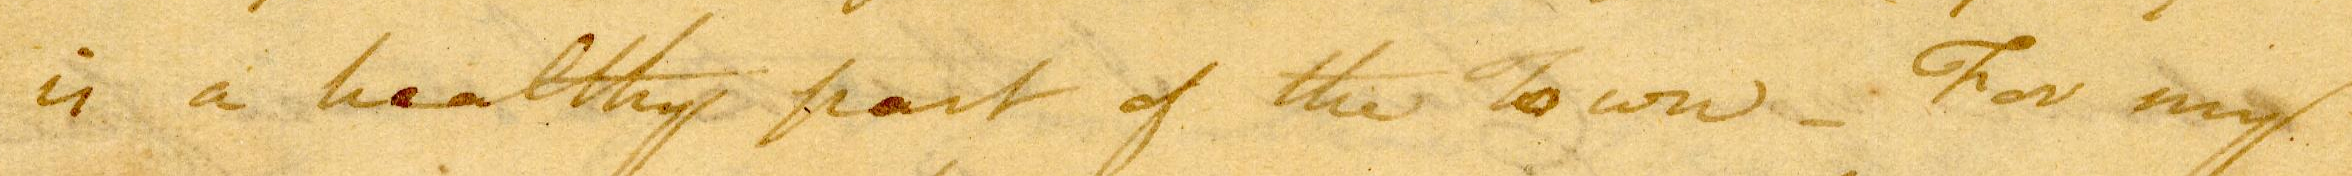is a healthy part of the Town. For my
